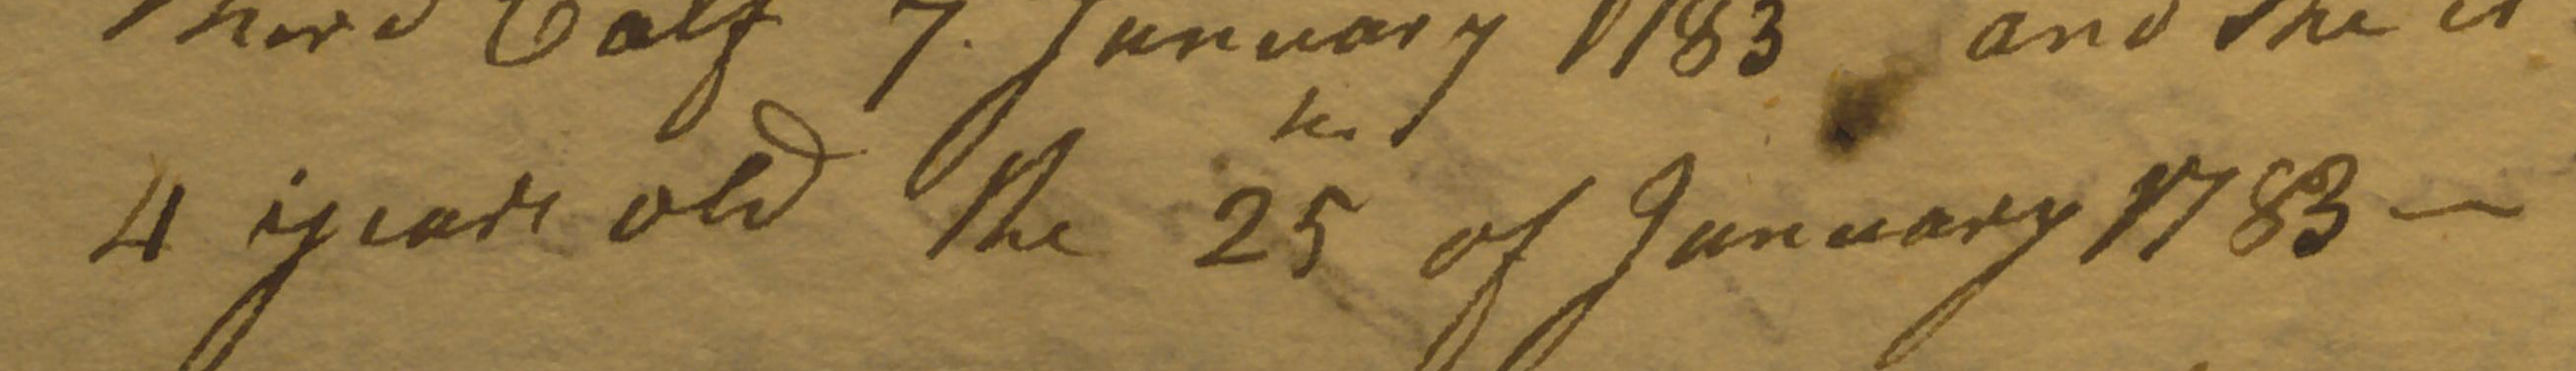4 years old the 25^th of January 1783-
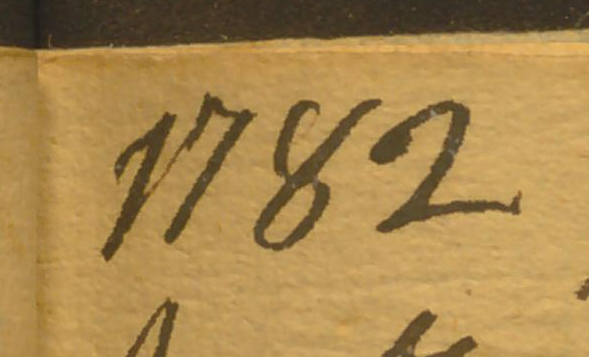1782
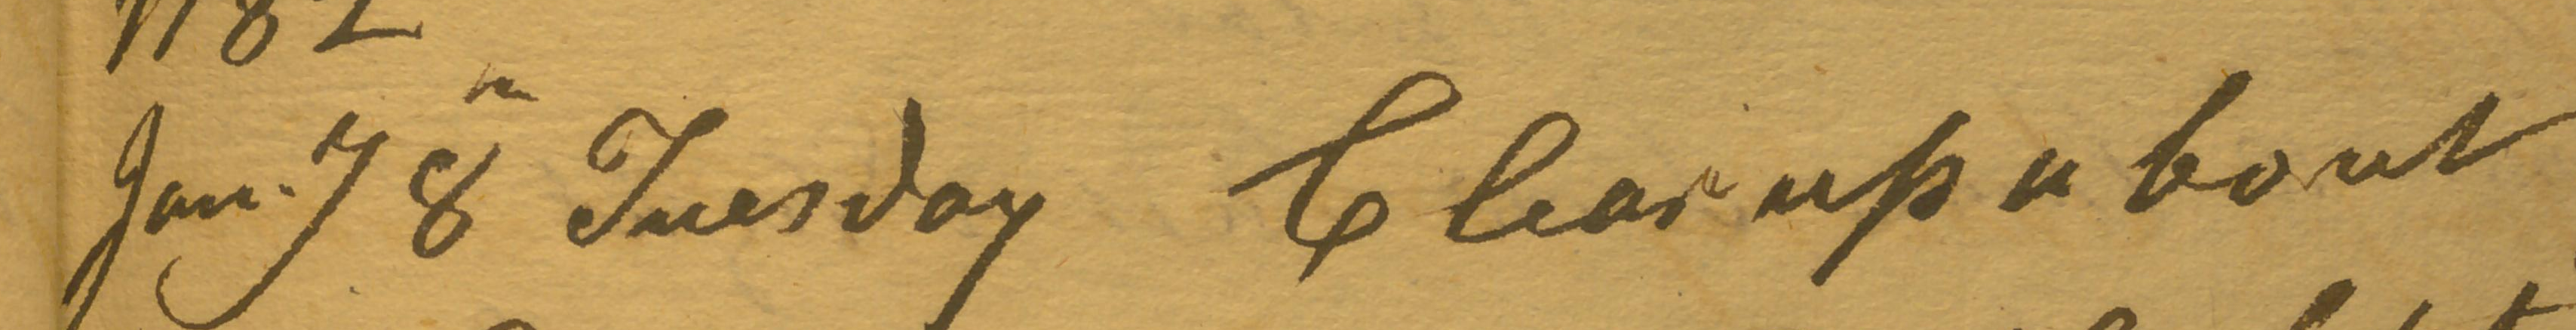Jan^y. 8^th Tuesday Clear up about
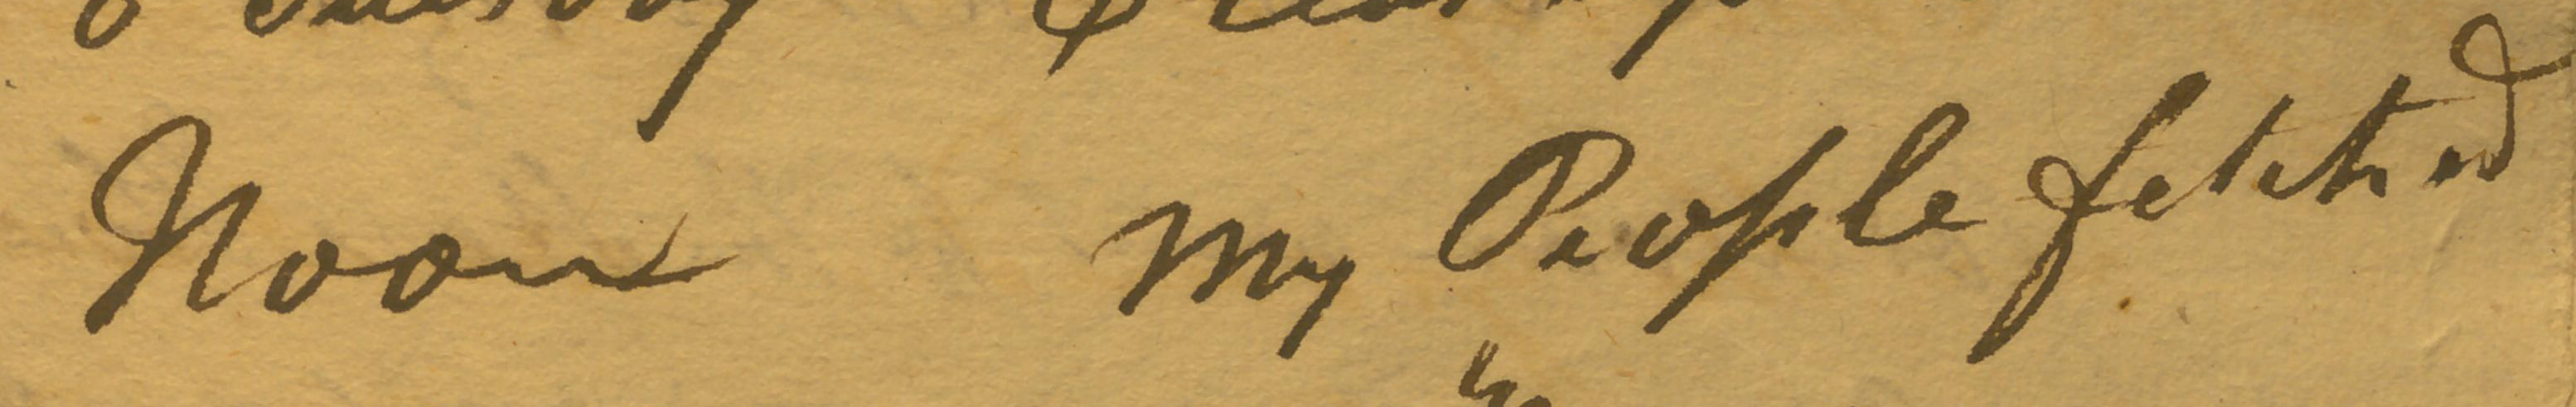Noon my People fetched
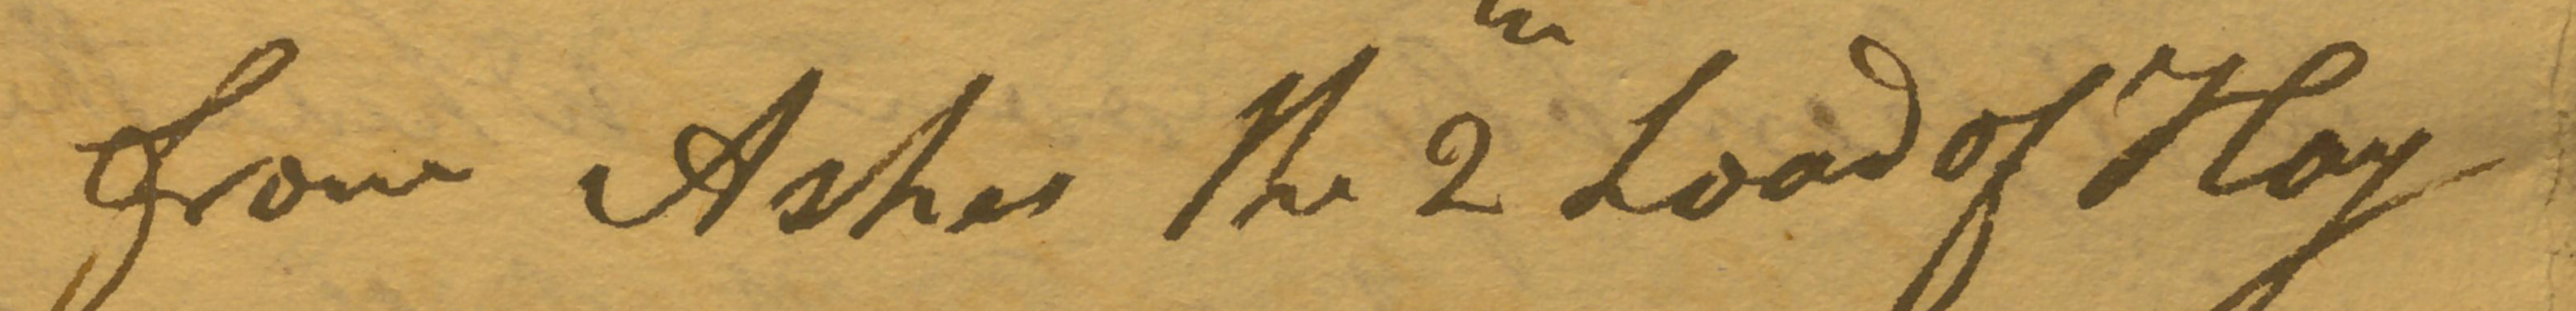from Ashes the 2^th Load of Hay
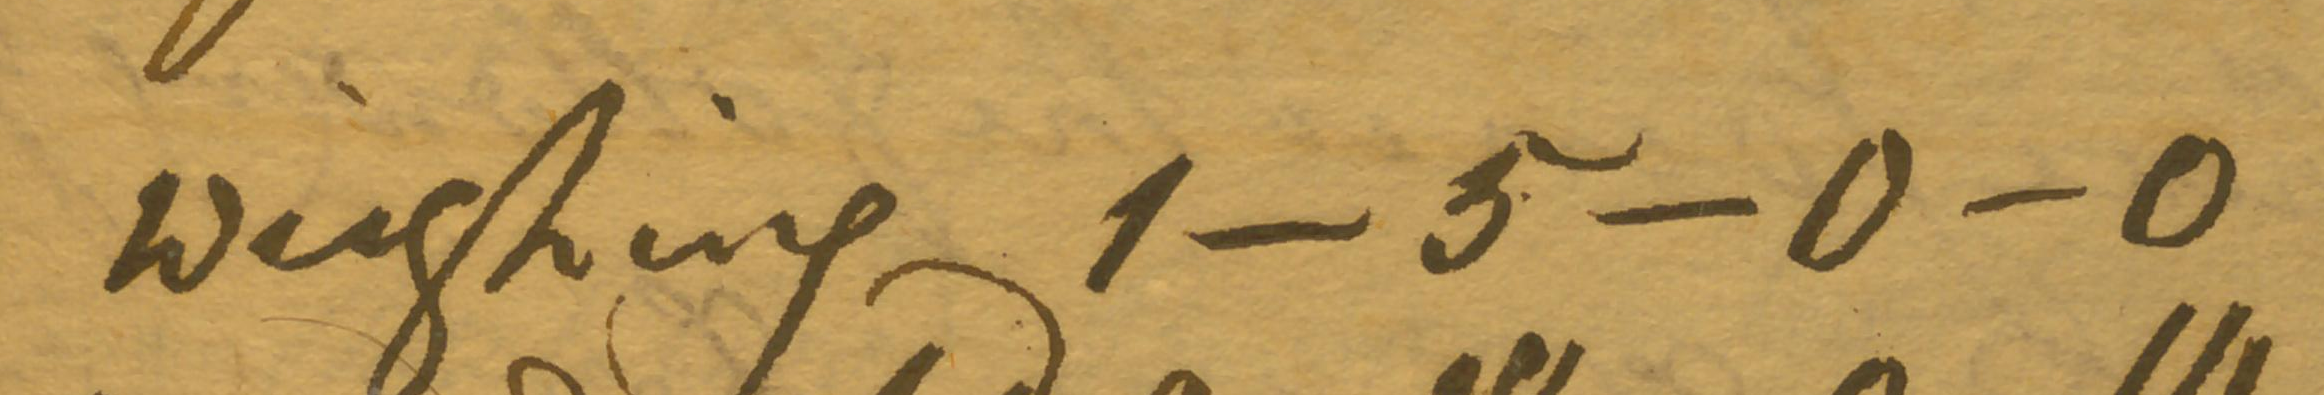Weighing 1-5-0-0
